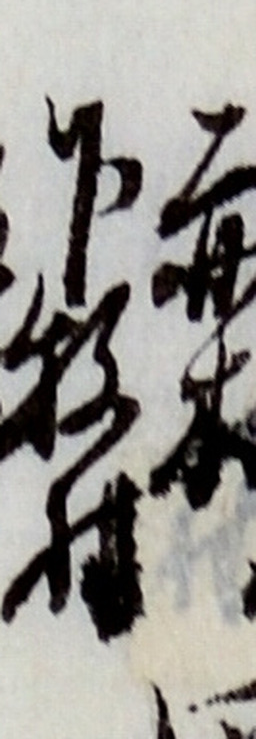下牧村
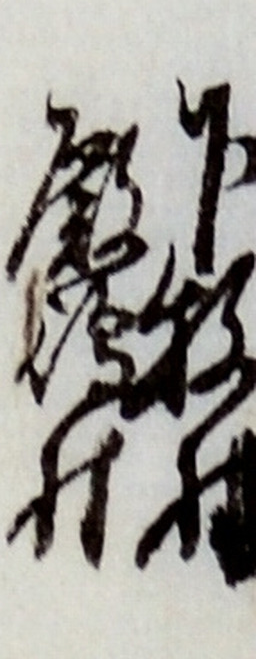殿島村
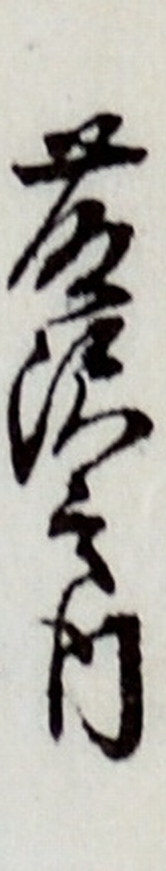藤沢ノ内
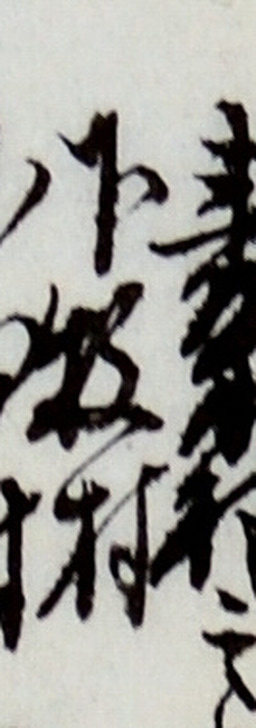下牧村
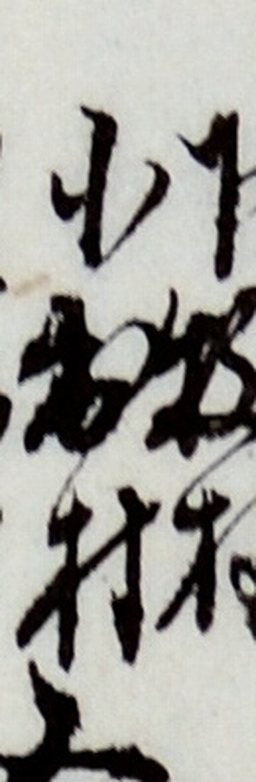小出村
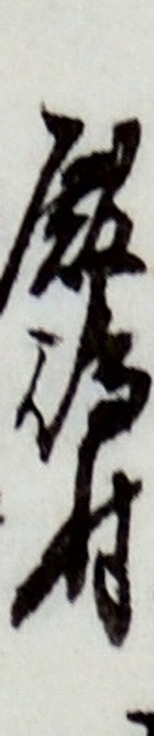殿島村
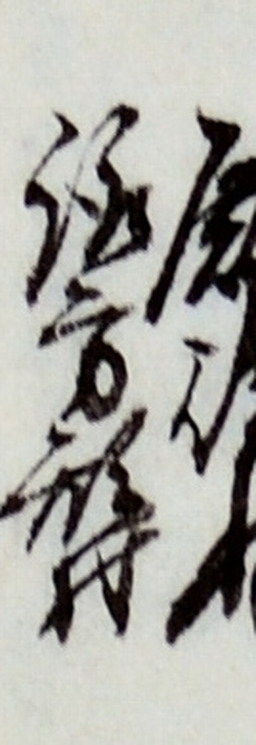諏訪形村
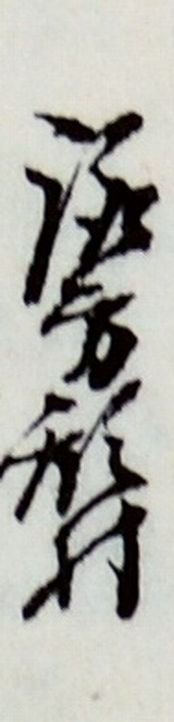諏訪形村
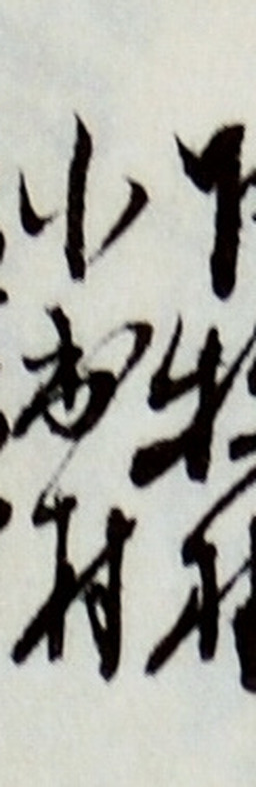小出村
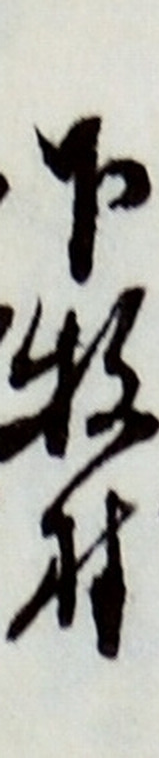下牧村
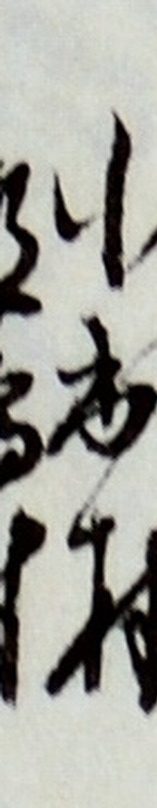小出村
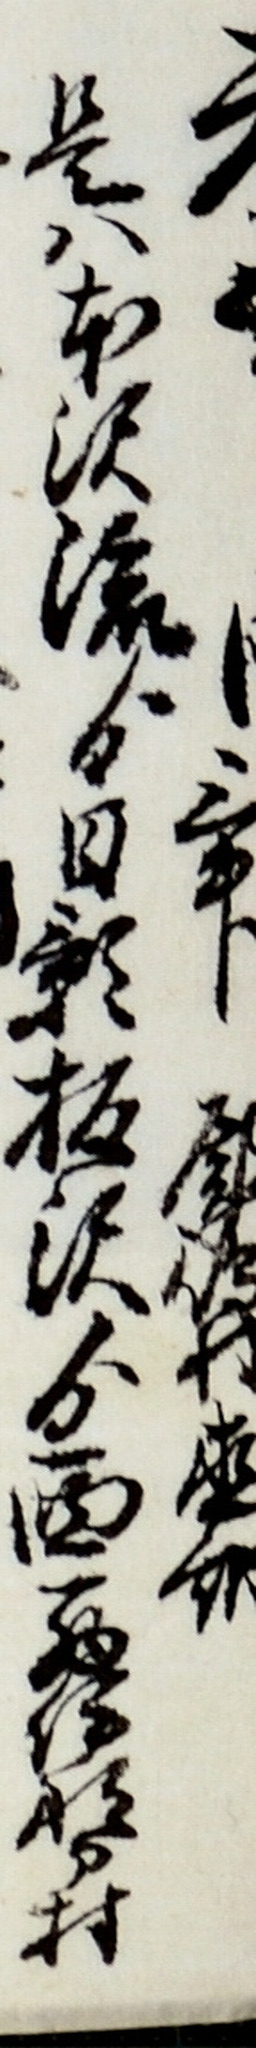是ハ本沢流より日影板沢より西西伊那部村
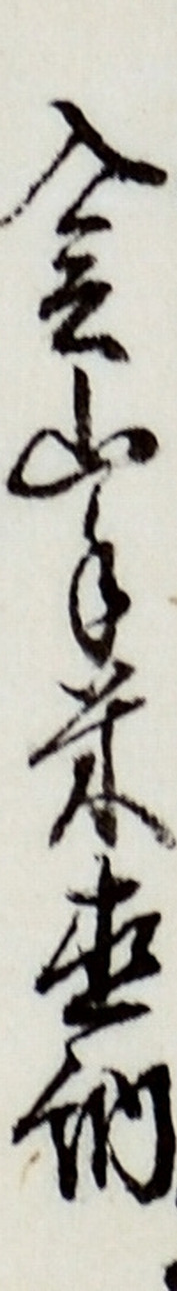入会山手米直納
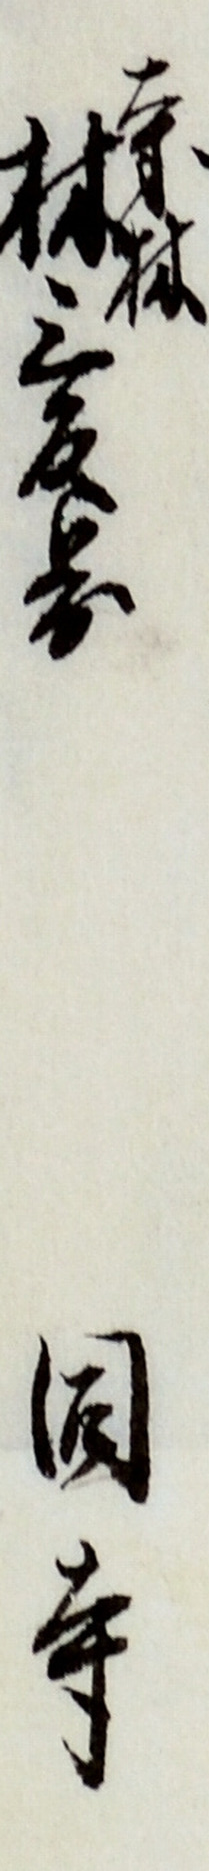林三反歩同寺
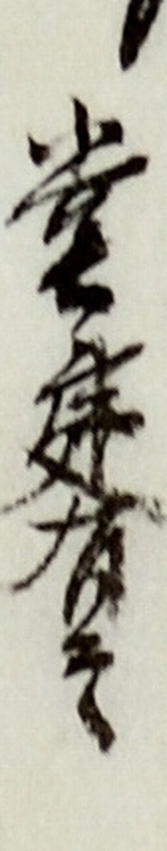堂建有之
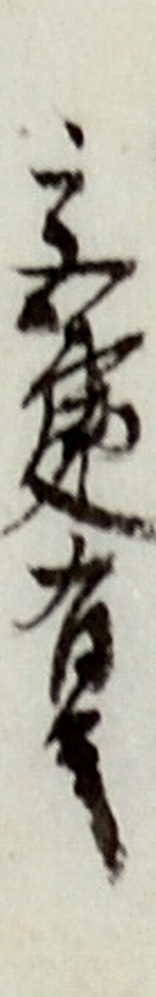宮建有之
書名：御領分中山林社地手控
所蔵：伊那市立高遠町図書館・合同会社AMANE
